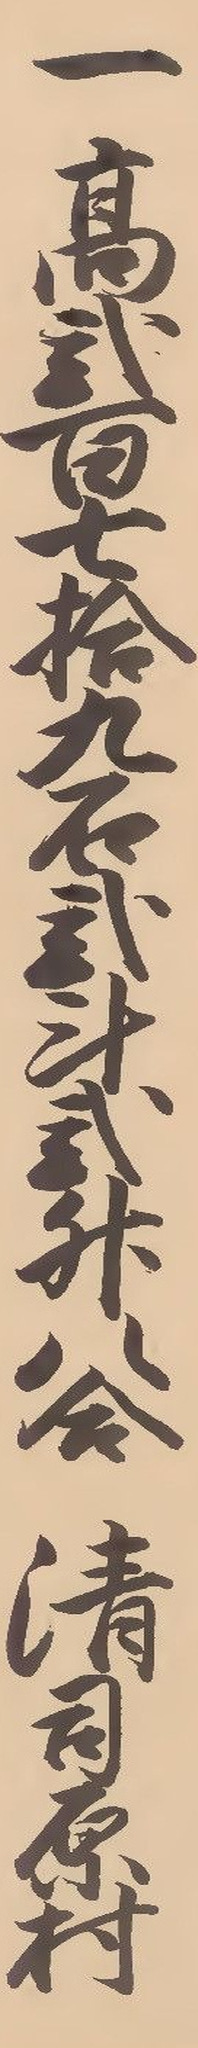一高弐百七拾九石弐斗弐升八合清司原村
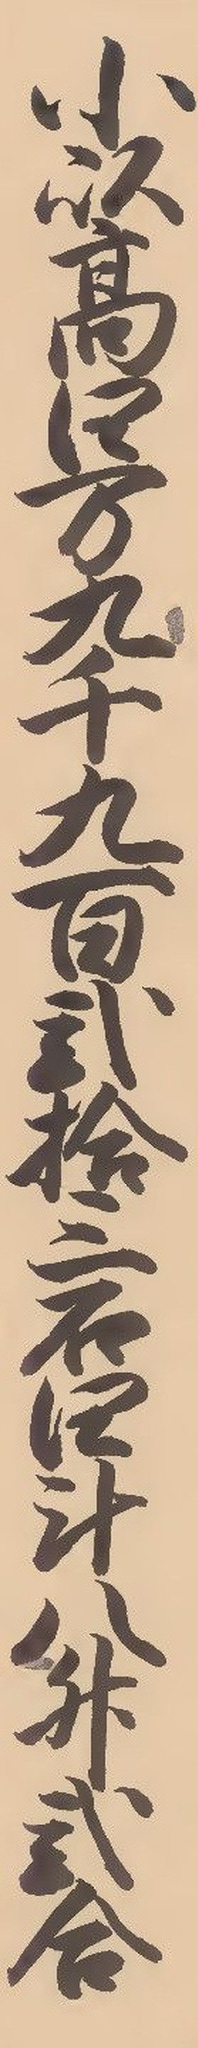小以高四万九千九百弐拾三石四斗八升弐合

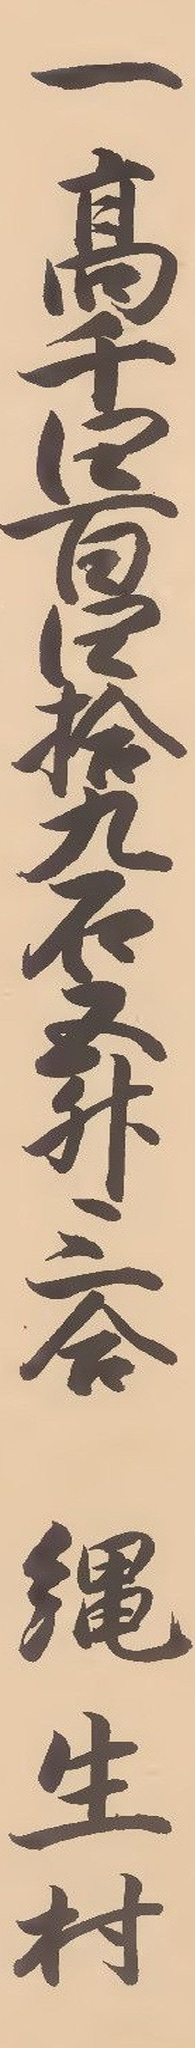一高千四百四拾九石五升三合縄生村

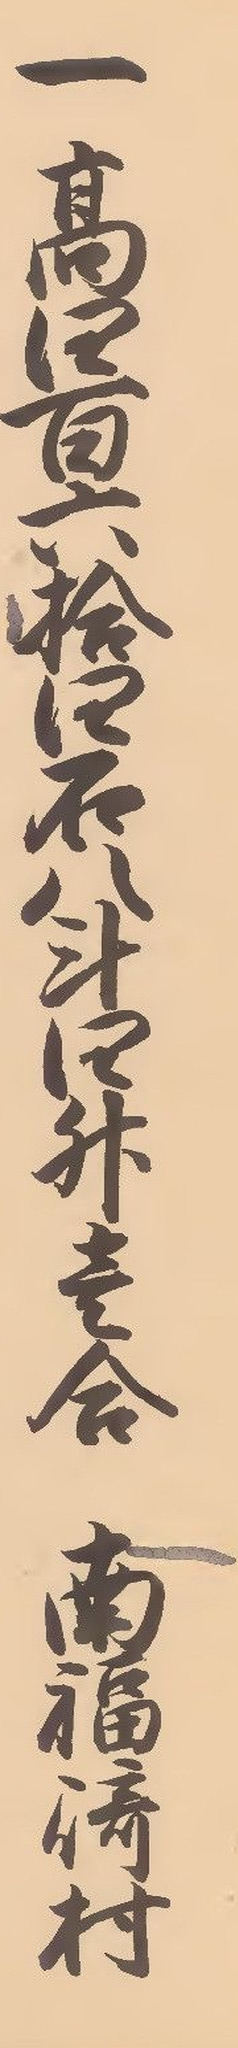一高四百六拾四石八斗四升壱合南福崎村
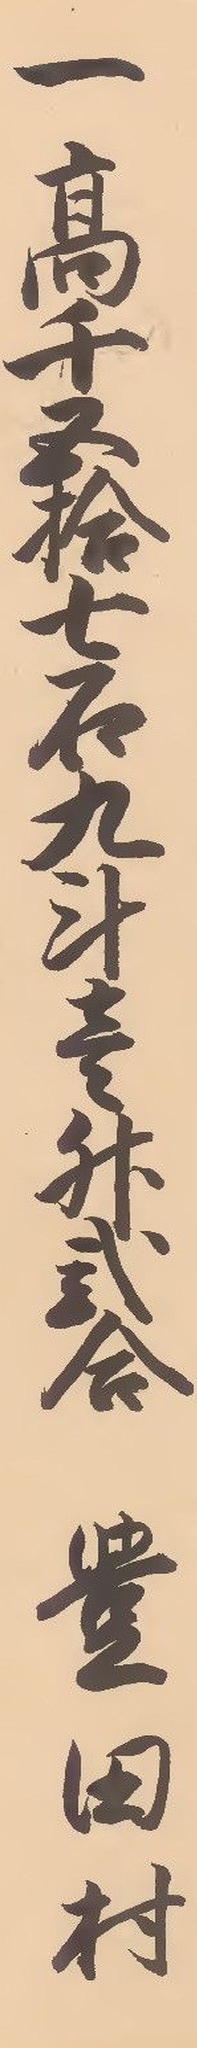一高千五拾七石九斗壱升弐合豊田村
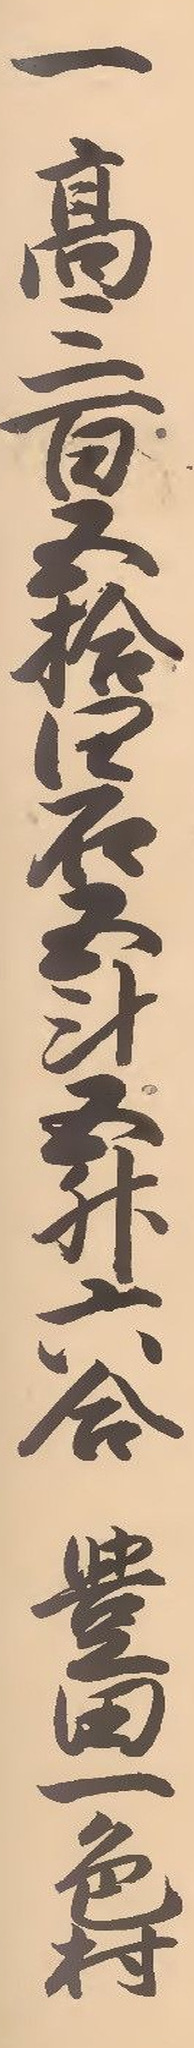一高三百五拾四石五斗五升六合豊田一色村
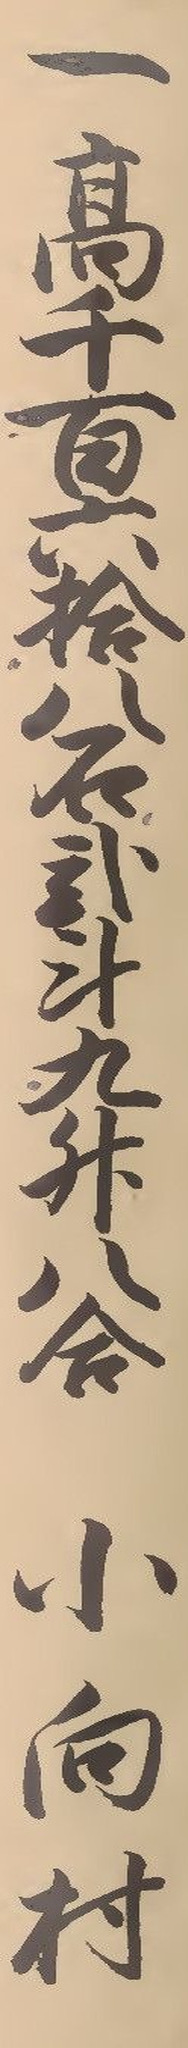一高千百六拾八石弐斗九升八合小向村
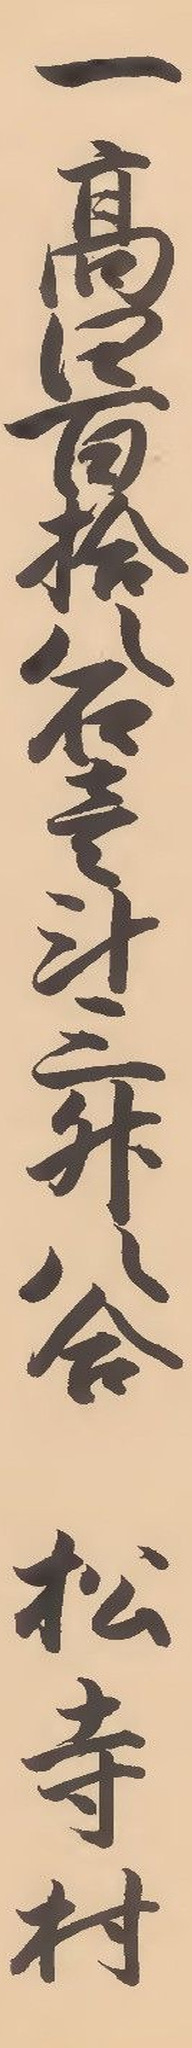一高四百拾八石壱斗三升八合松寺村
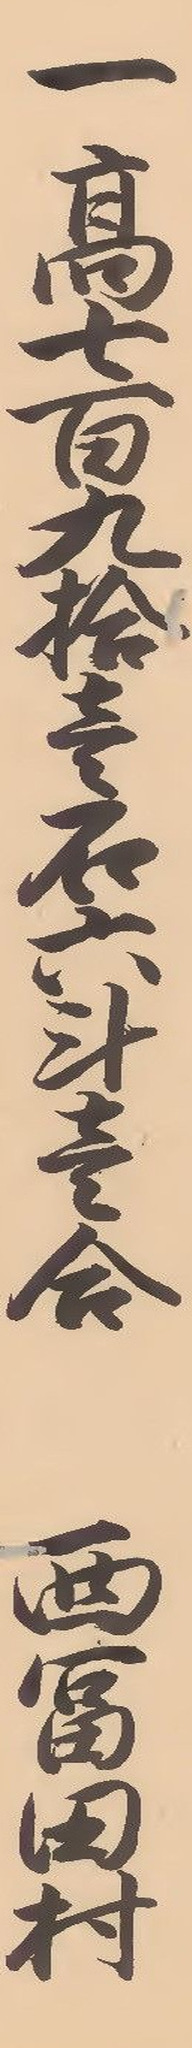一高七百九拾壱石六斗壱合西富田村

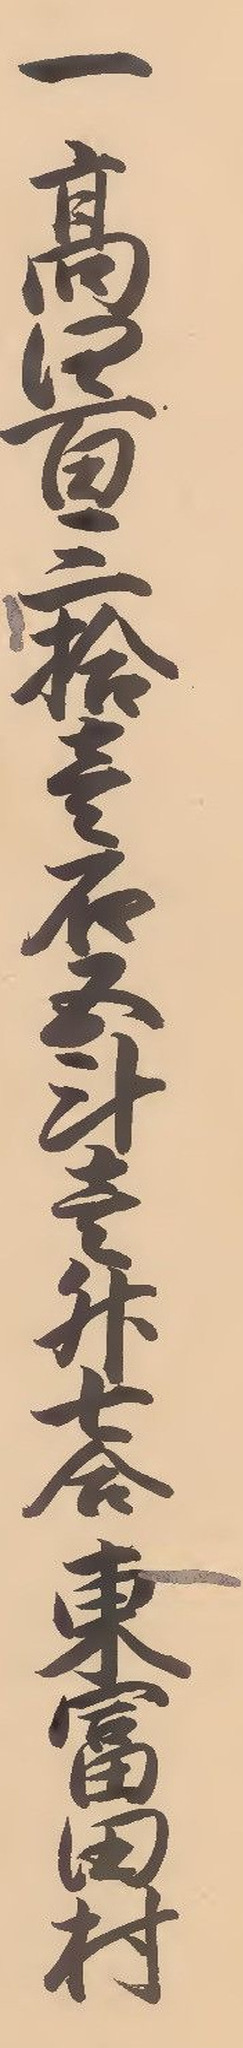一高四百三拾壱石五斗壱升七合東富田村
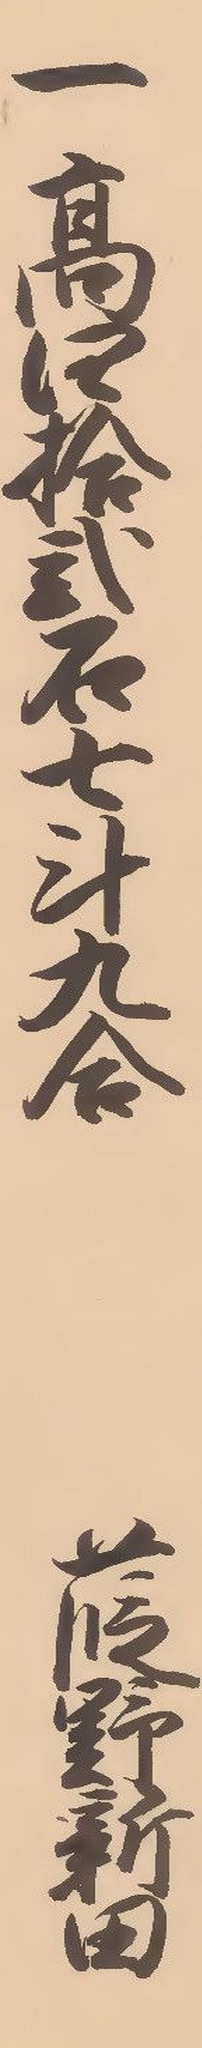一高四拾弐石七斗九合葭野新田
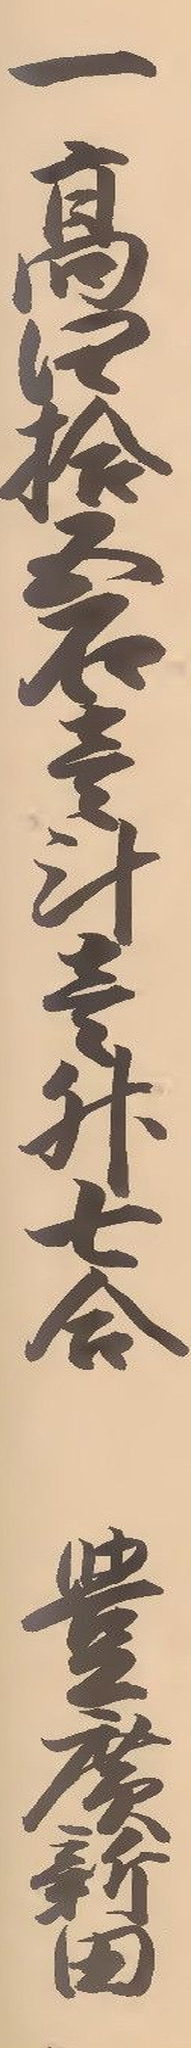一高四拾五石壱斗壱升七合豊広新田
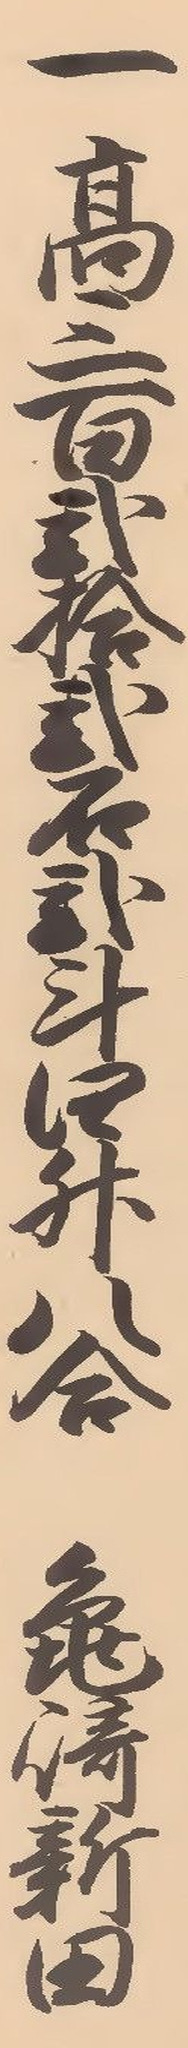一高三百弐拾弐石弐斗四升八合亀崎新田
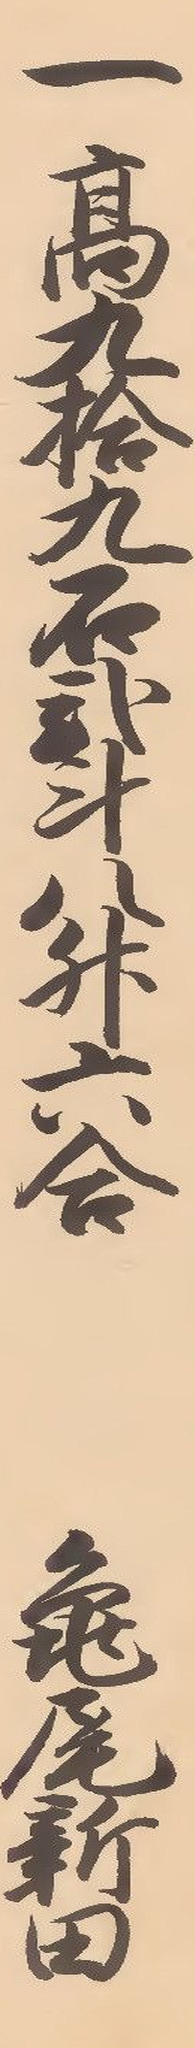一高九拾九石弐斗八升六合亀尾新田
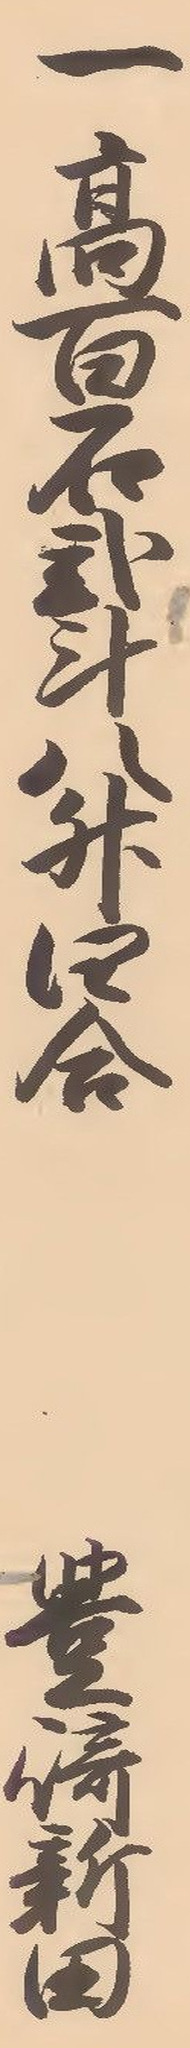一高百石弐斗八升四合豊崎新田

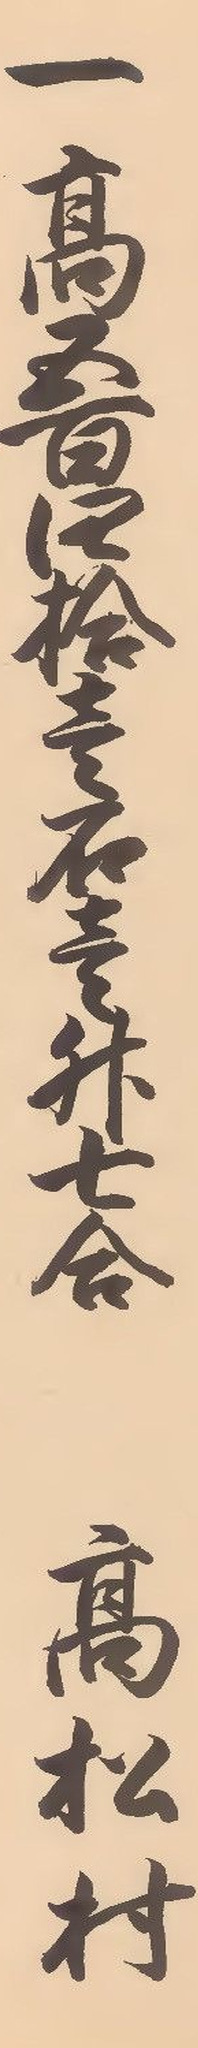一高五百四拾壱石壱升七合高松村
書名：伊勢国郷帳
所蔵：国立公文書館 National Archives of Japan
